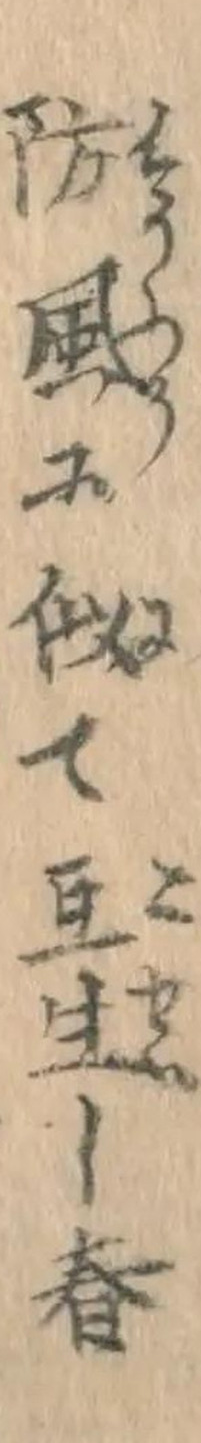防風に似て互生し春
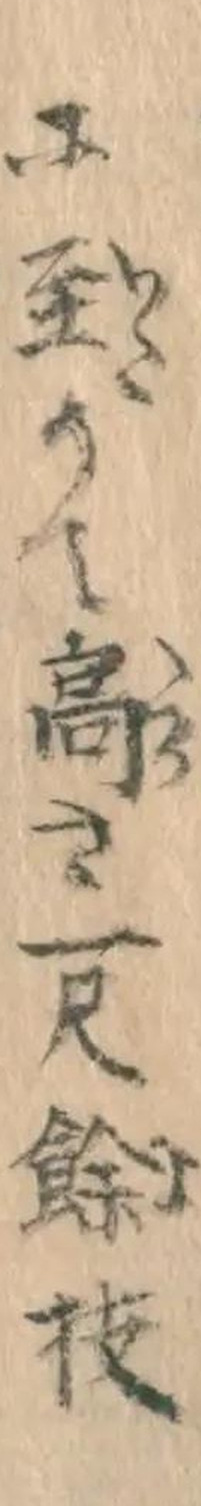に至りて高さ一尺余枝
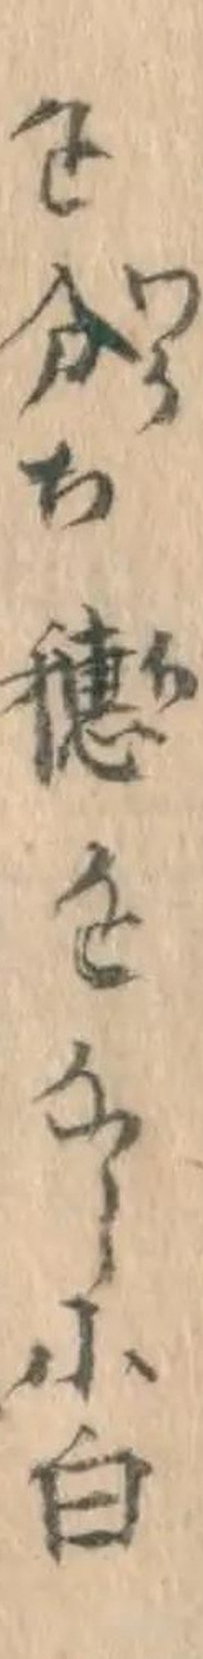を分ち穂をなし小白
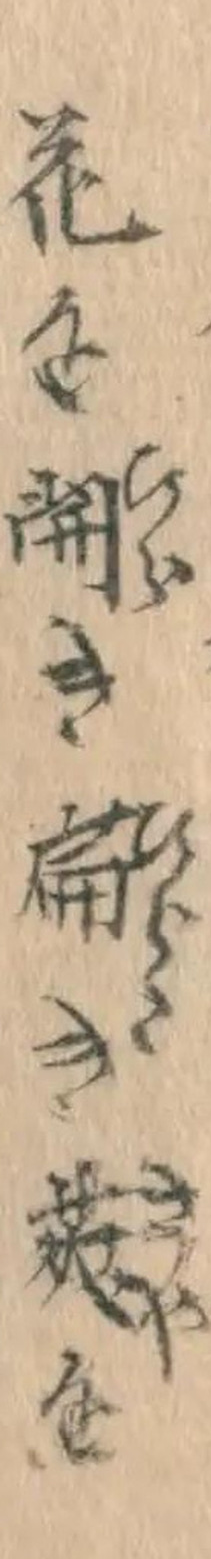花を開き扁き莢を
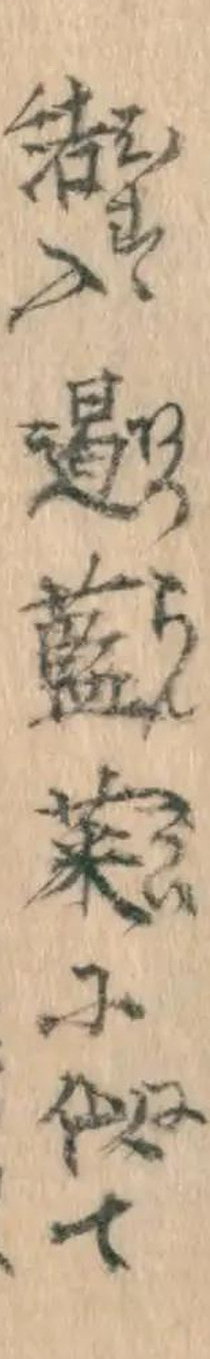結ふ遏藍菜に似て
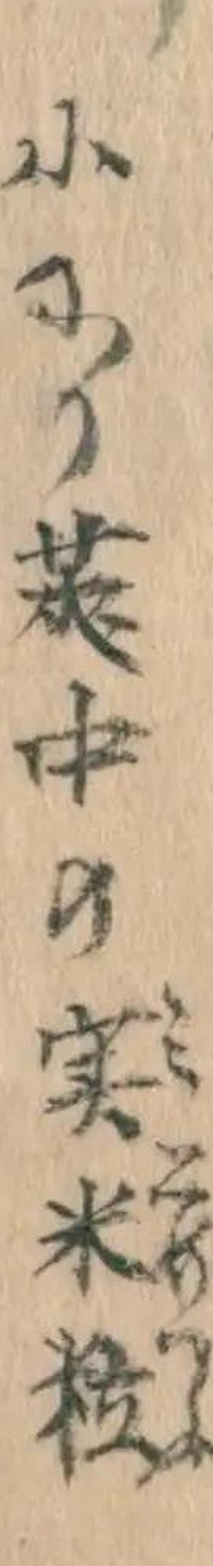小なり莢中の実米粒
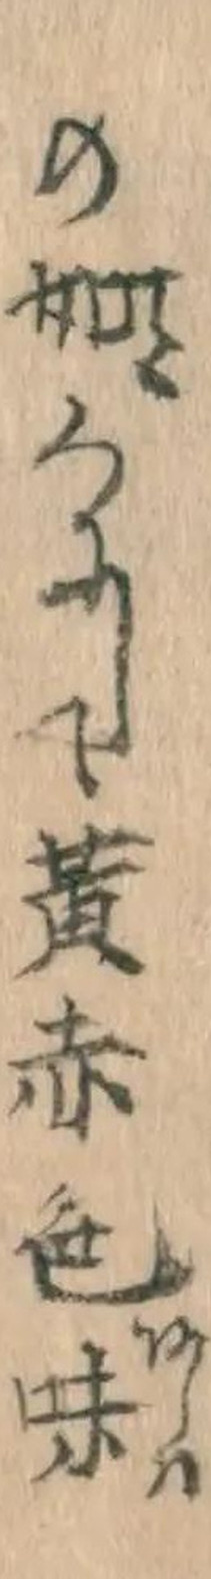の如くにして黄赤色味
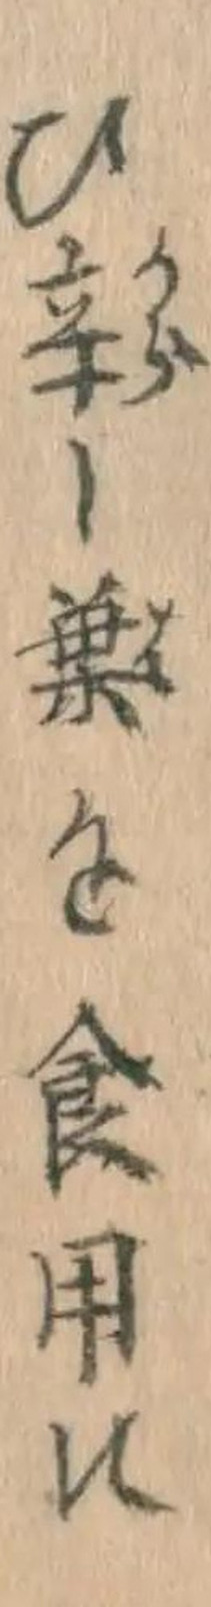ひ辛し葉を食用す
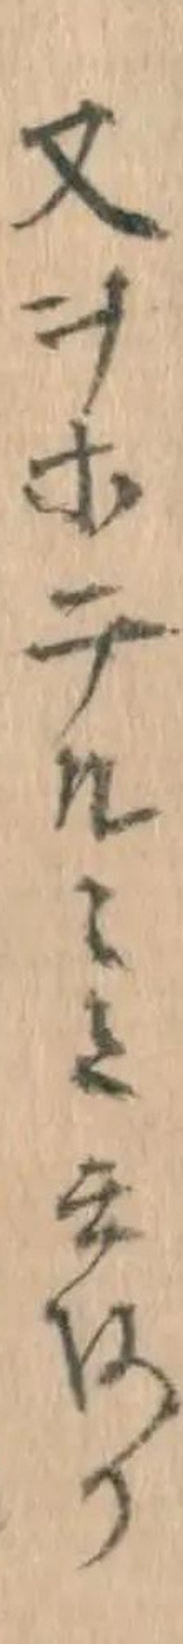又ヲホテルと云あり
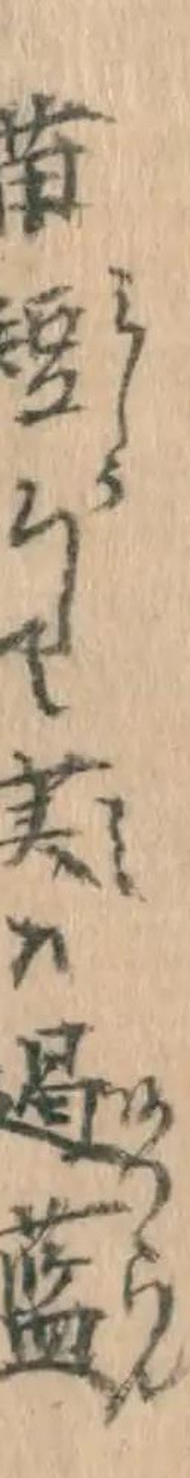苗短くして実は遏藍
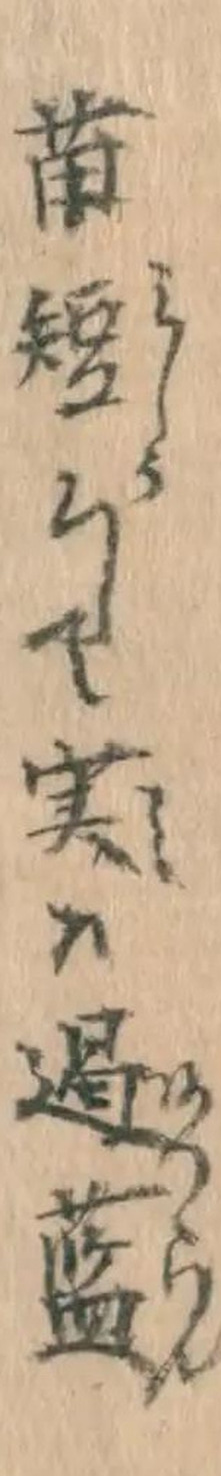苗短くして実は遏藍

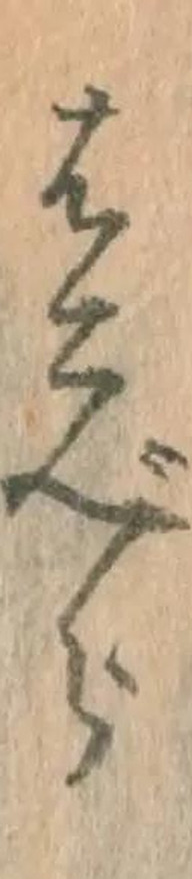はこべら
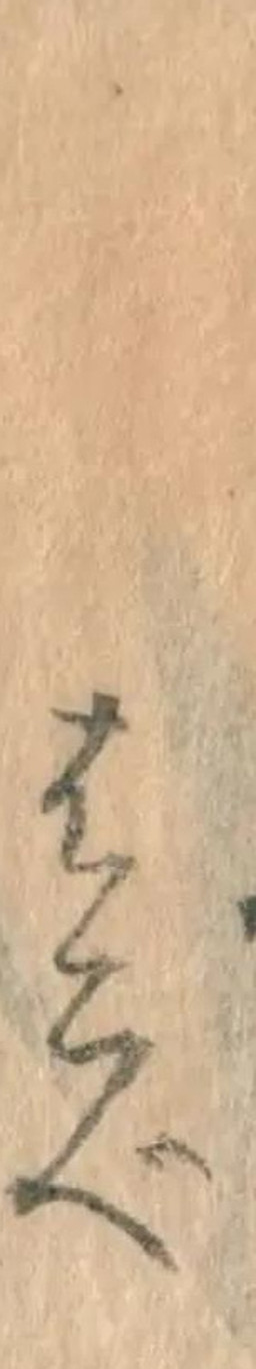はこべ
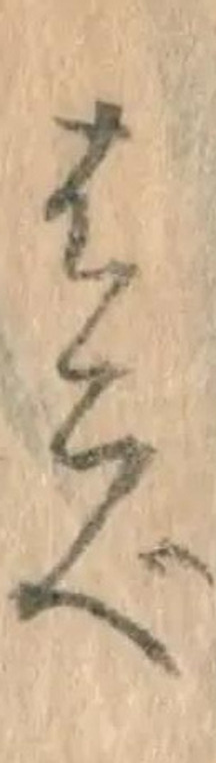はこべ
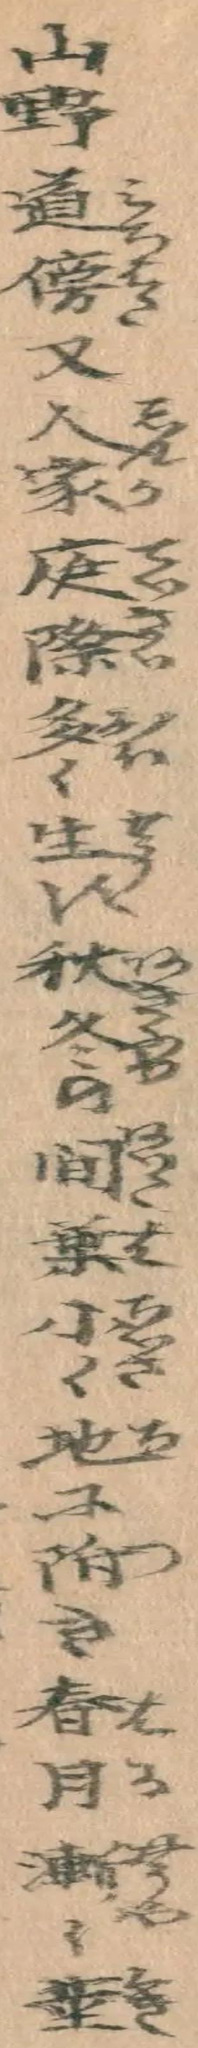山野道傍又人家庭際多く生す秋冬の間葉小く地に附き春月漸く茎
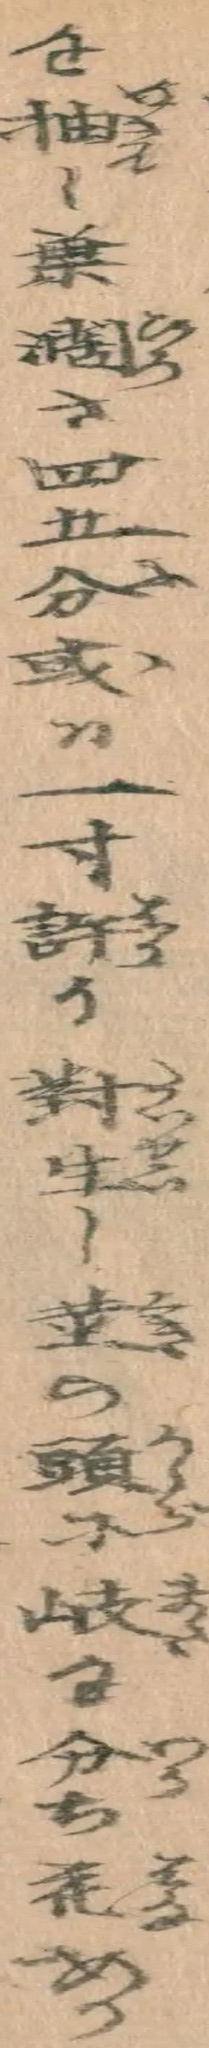を抽し葉闊さ四五分或は一寸許り対生し茎の頭に岐を分ち花あり
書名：本草図譜. 巻46-48
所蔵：国立国会図書館 National Diet Library, JAPAN
